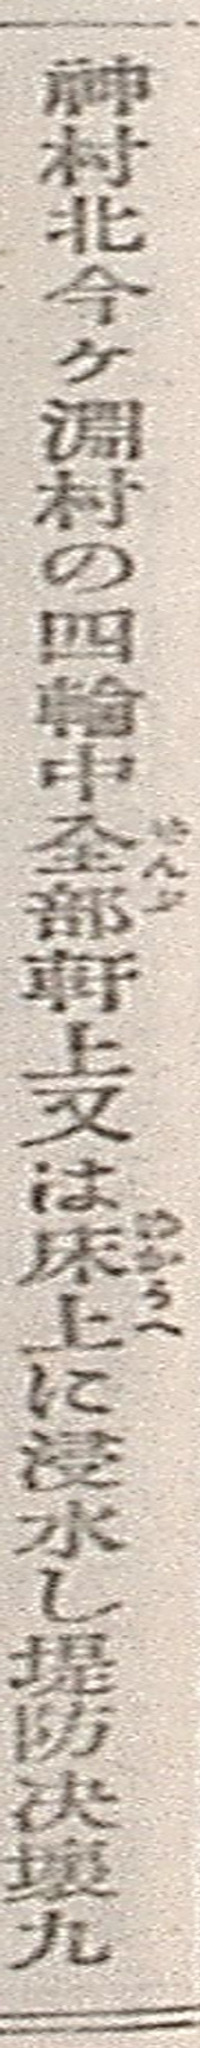神村北今ヶ淵村の四輪中全部軒上又は床上に浸水し堤防決壊九
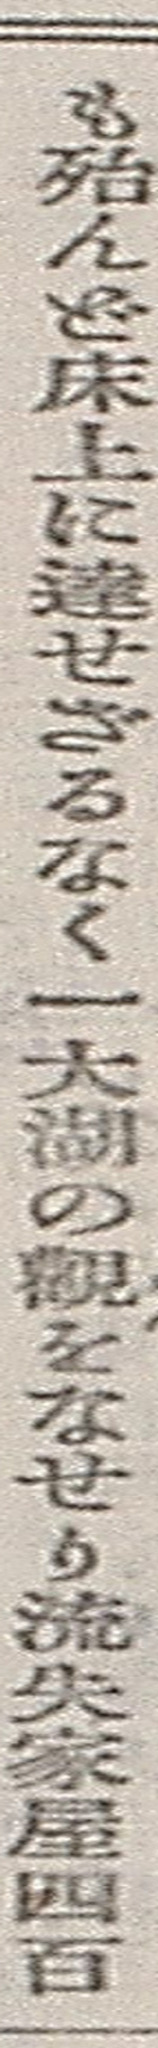も殆ど床上に達せざるなく一大湖の観をなせり流失家屋四百
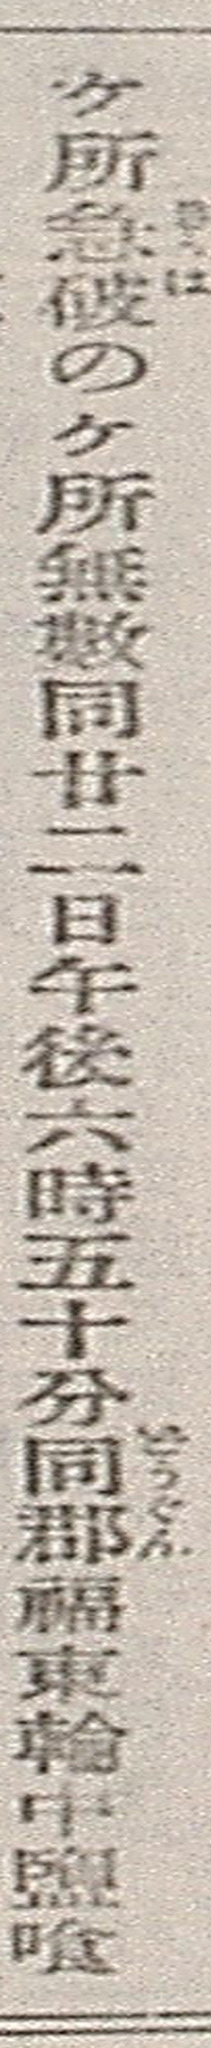ヶ所急破のヶ所無数同廿二日午後六時五十分同郡福東輪中塩喰
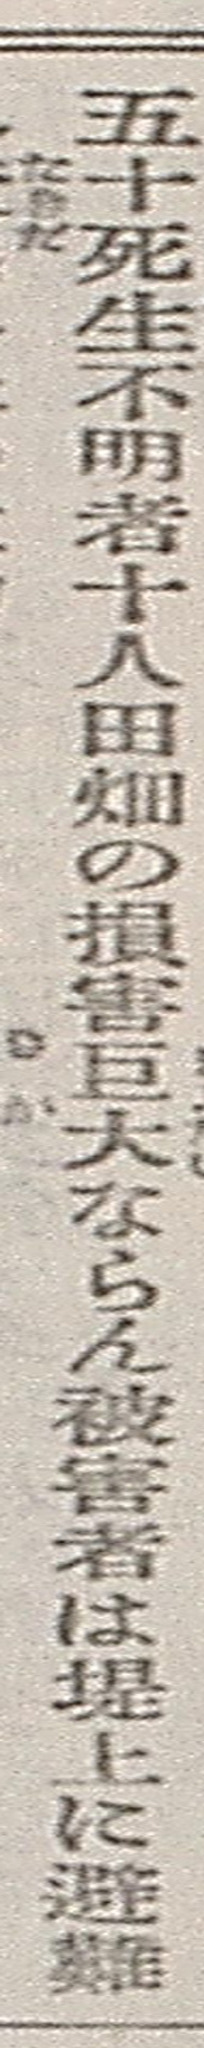五十死生不明者十人田畑の損害巨大ならん被害者は堤右上に避難
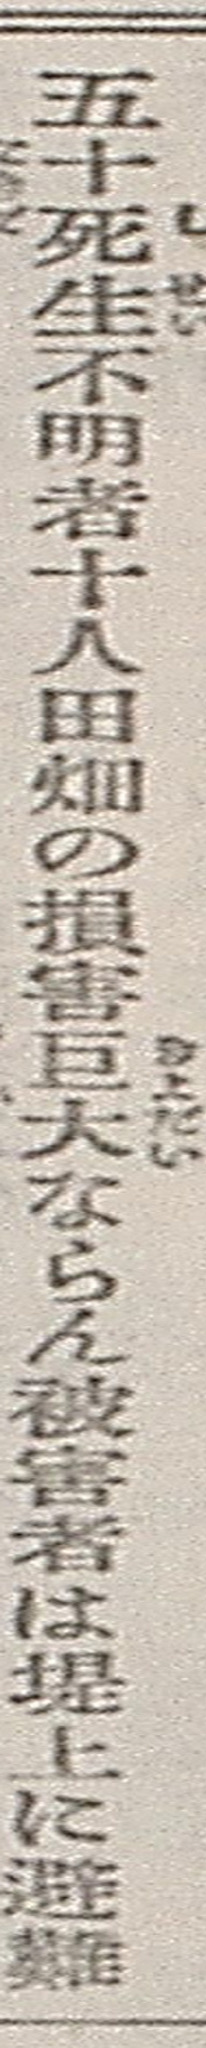五十死生不明者十人田畑の損害巨大ならん被害者は堤右上に避難
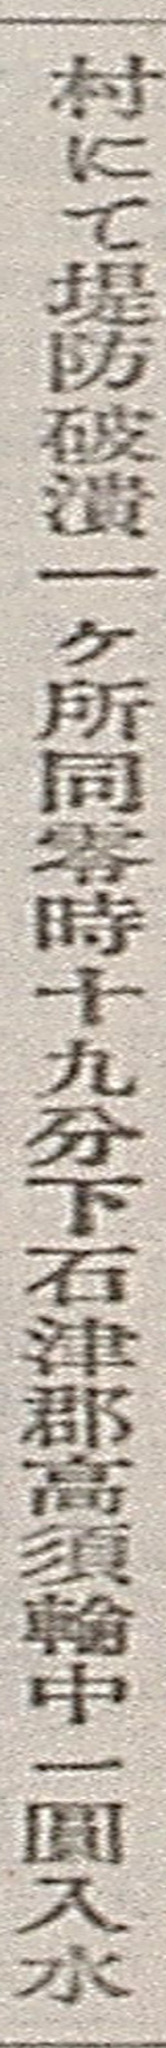村にて堤防破潰一ヶ所同零時十九分下石津郡高須輪中一円入水
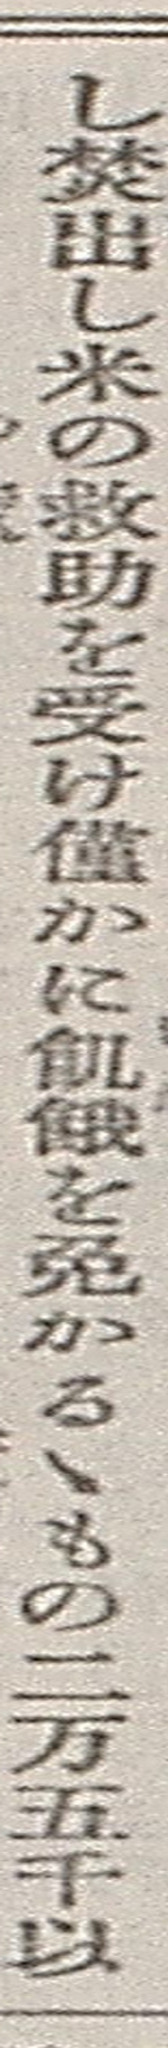し焚出し米の救助を受け僅かに飢餓を免れるゝもの二万五千以
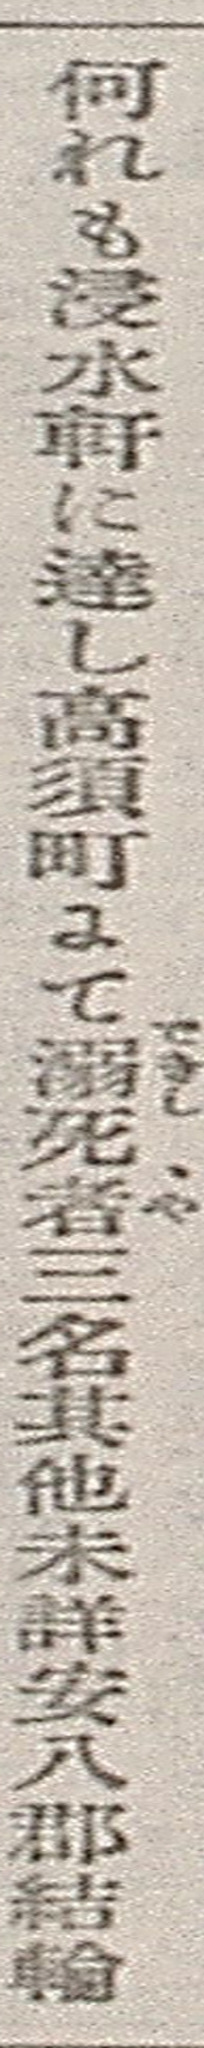何れも浸水軒に達し高須町にて溺死者三名其他未詳安八郡結輪
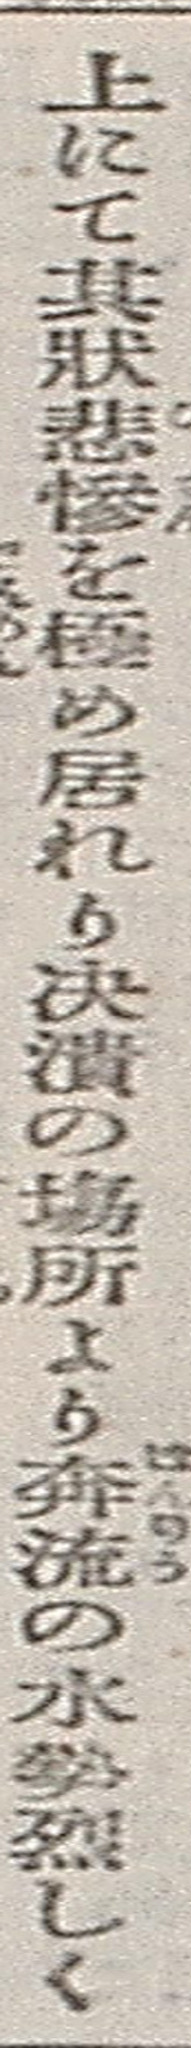上にて其状悲惨を極め居れり决潰の場所より奔流の水勢烈しく
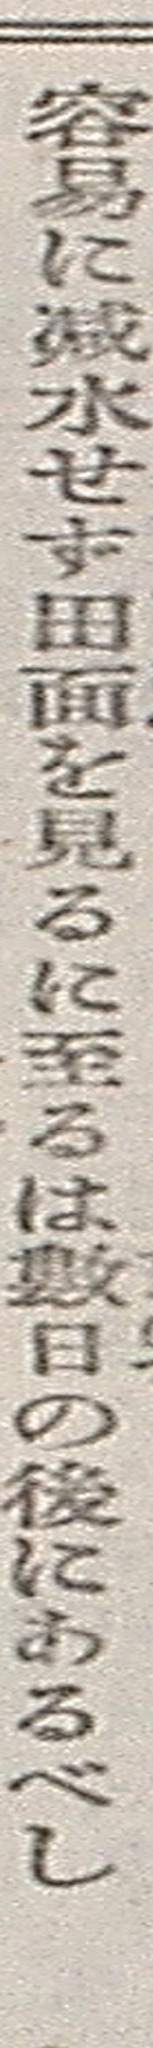容易に減水せず田面を見るに至るは数日の後にあるべし
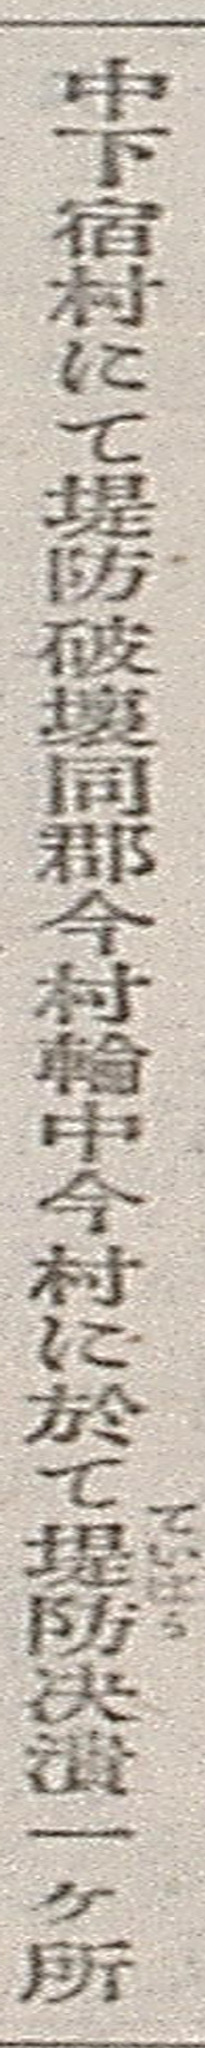中下宿村にて堤防破壊同軍今村輪中今村に於て堤防决潰一ヶ所
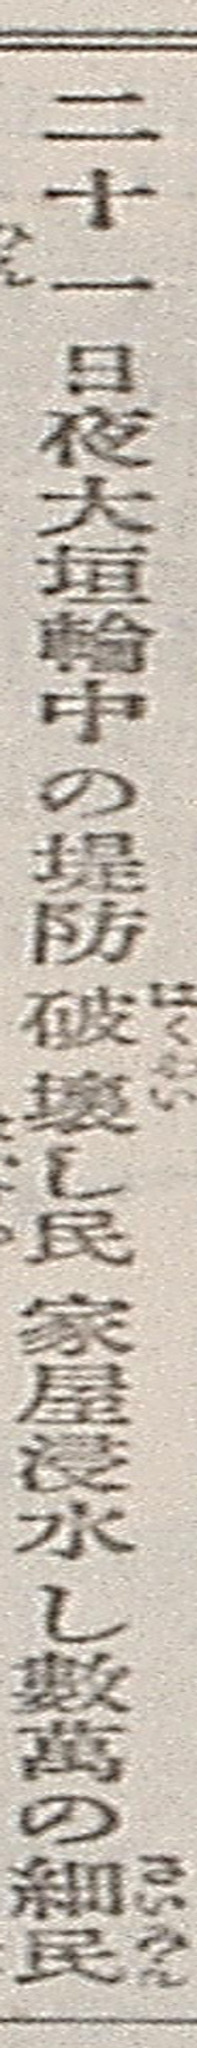二十一日夜大垣輪中の堤防破壊し民家屋浸水し数万の細民
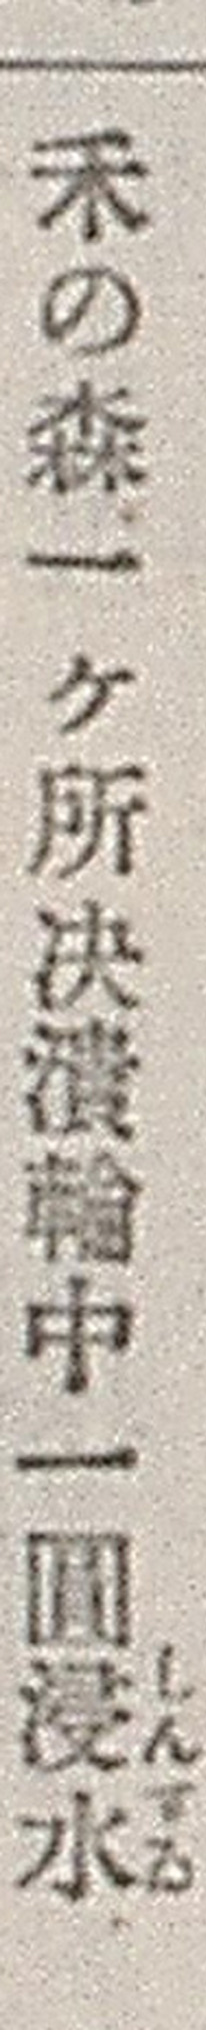禾の森一ヶ所决潰輪中一円浸水
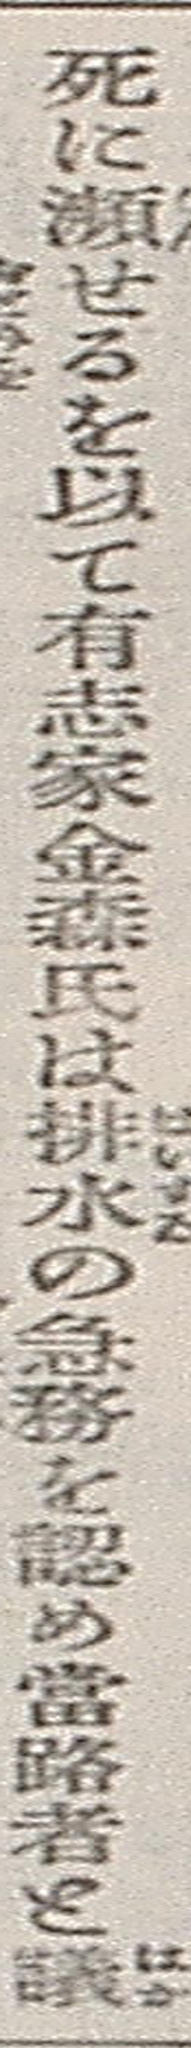死に瀕せるを以て有志家金森氏は排水の急務を認め当事者と議
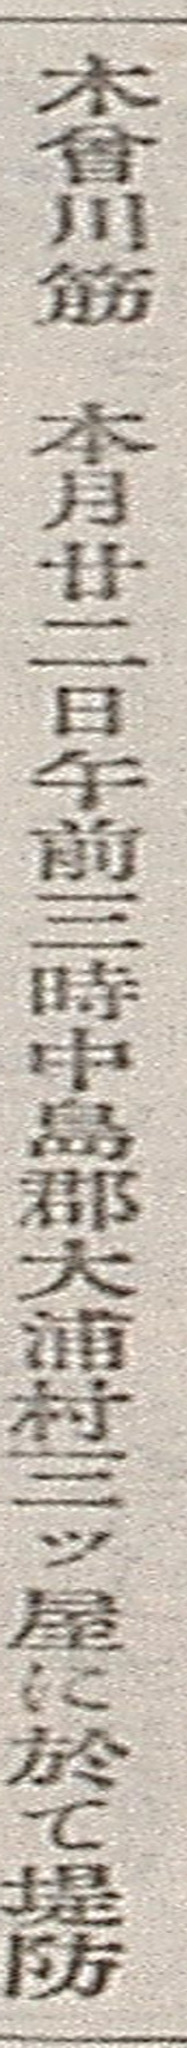木曽川筋本月廿二日午前三時中島郡大浦村三ッ屋に於て堤防
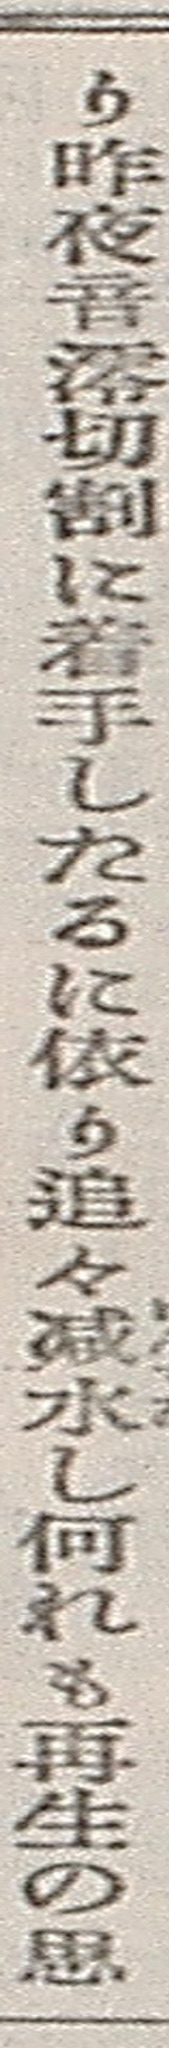り昨夜音澪切割に着手したるに依り追々減水し何れも再生の思
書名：風俗畫報臨時増刊第百二十六號　洪水被害録（中）
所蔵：東京大学地震研究所図書室 Earthquake Research Institute Library, The University of Tokyo, JAPAN
